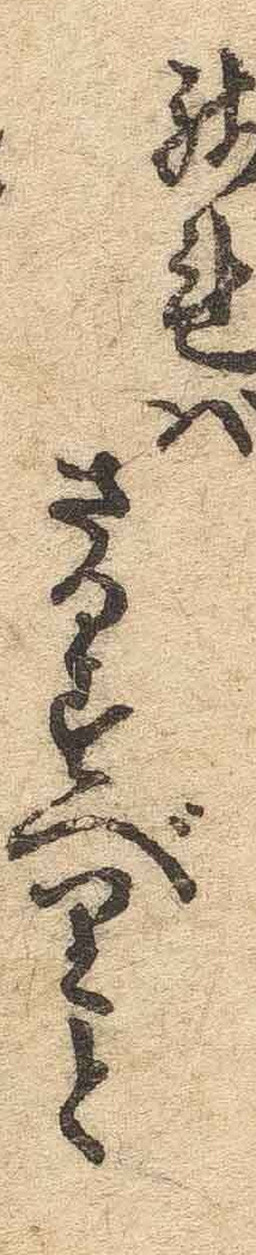さるすべりと
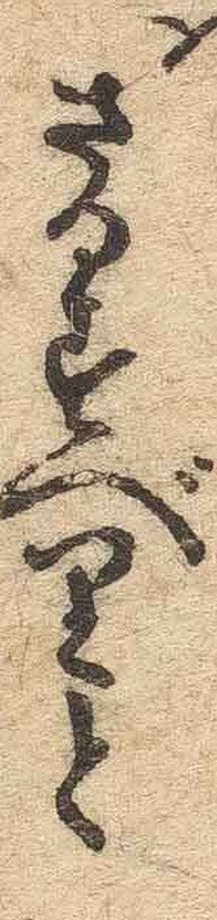さるすべりと
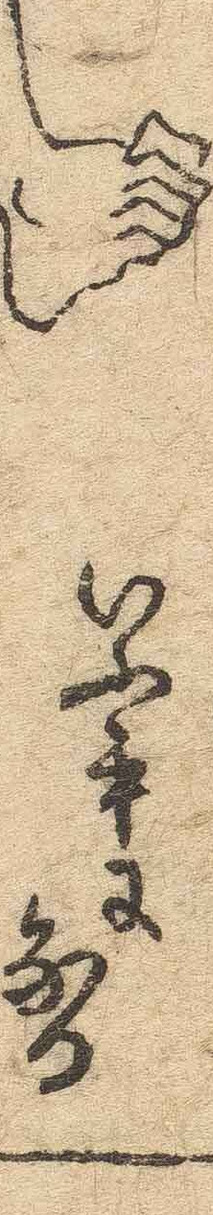いふ手になる
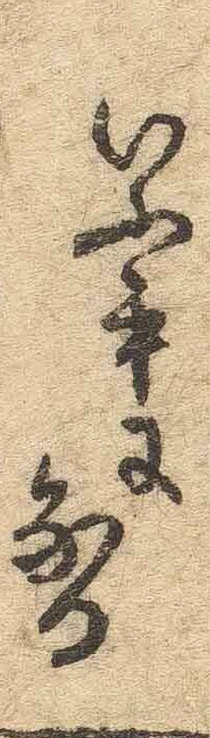いふ手になる
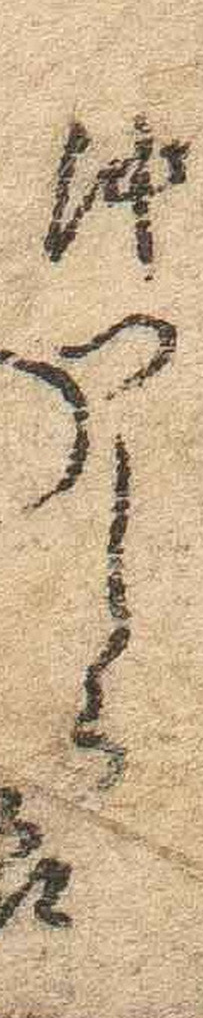沖つしら浪

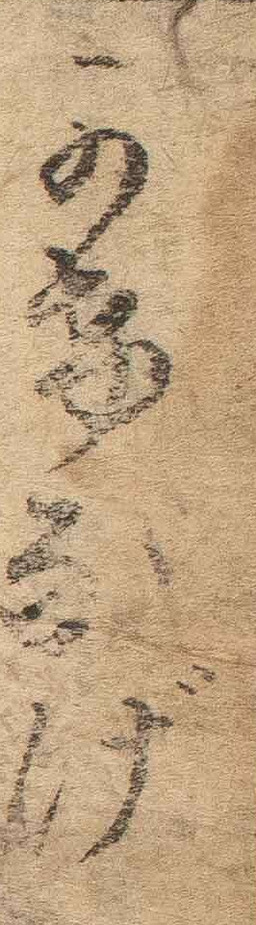かけなげ
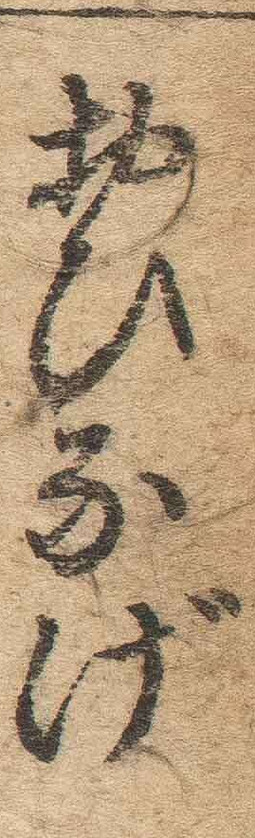おひなげ
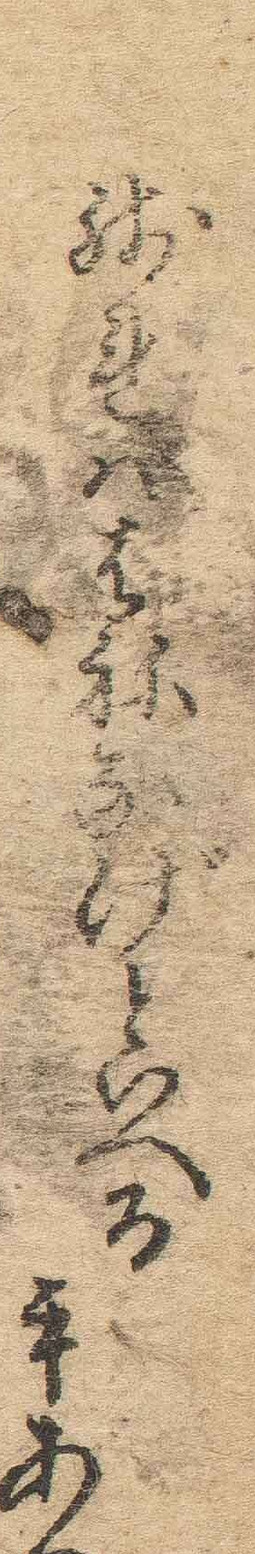残ればはねなげといへる手あり
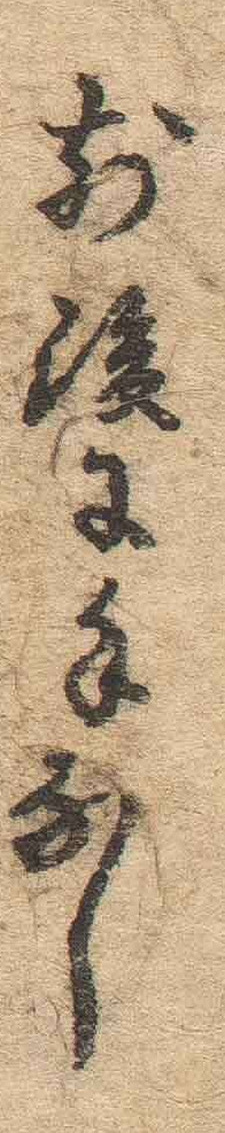前後に手なし
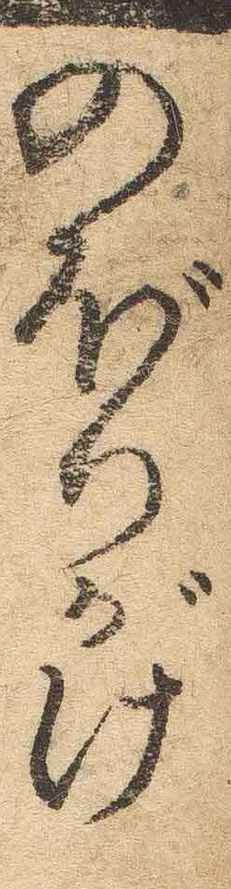のぼりかけ
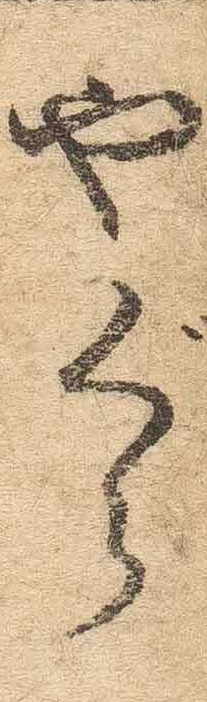やぐら
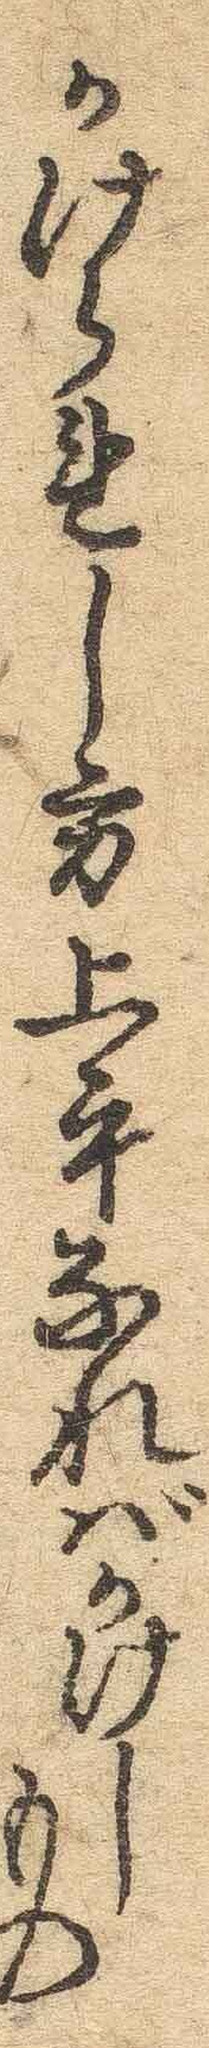かけられし方上手ならばかけしもの
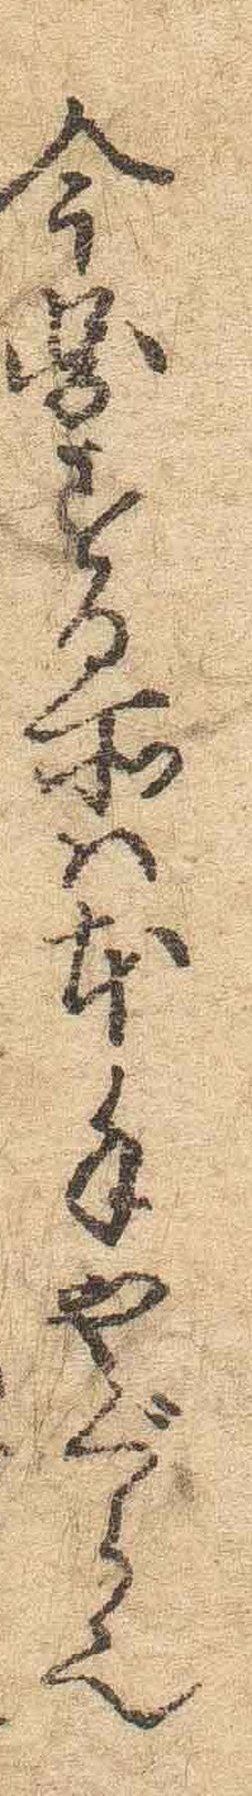今圖する所は本手やぐら也
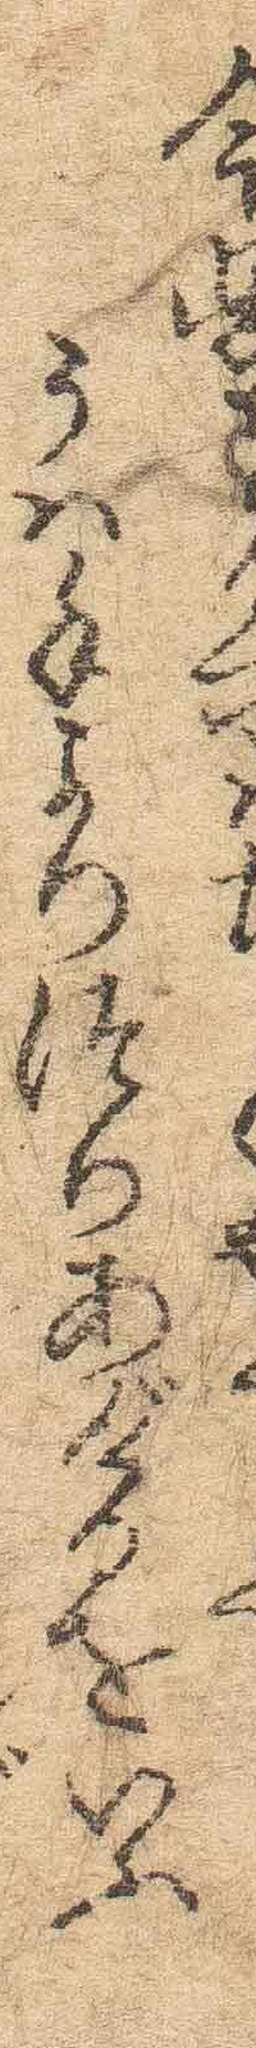うは手よりつりあげるをいふ
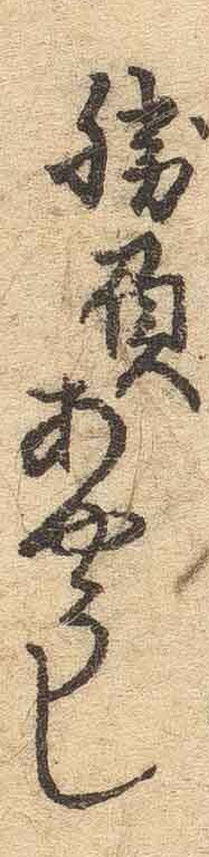勝負あやうし
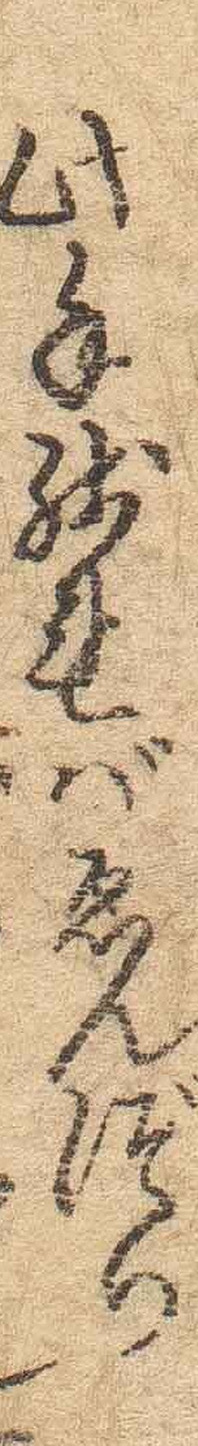此手残ればゑんずり
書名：古今相撲大全
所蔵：東京学芸大学附属図書館 国文学研究資料館
